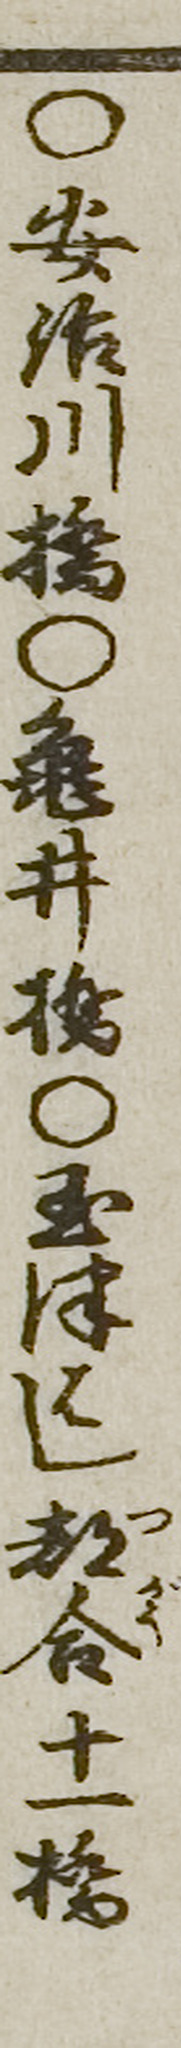○安治川橋○亀井橋○玉津はし都合十一橋
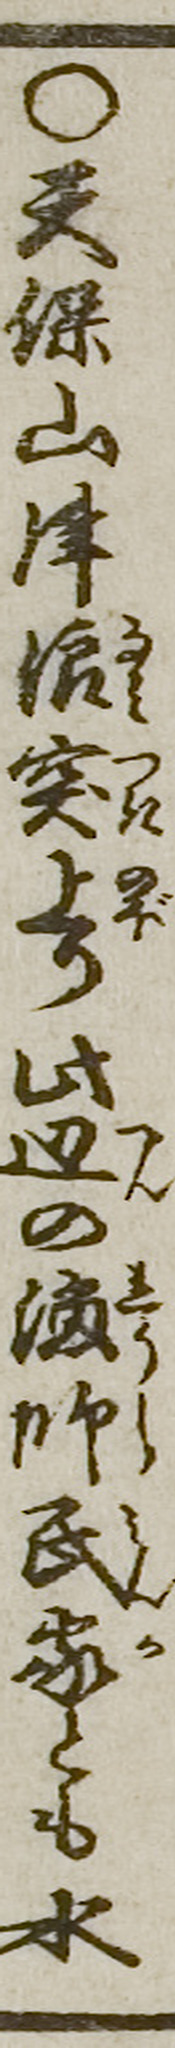○天保山津浪突上り此辺の漁師民家とも水
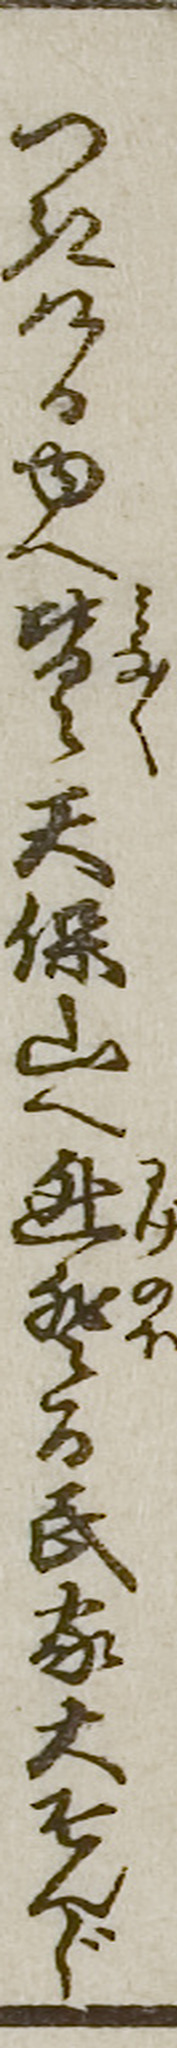つきけるゆへ皆々天保山へ逃登る民家大そんじ
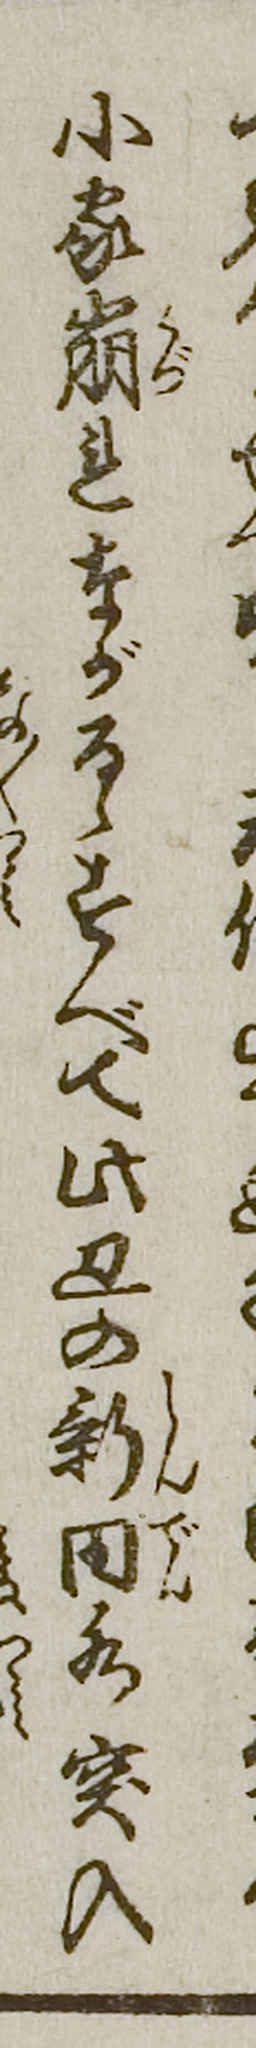小家崩れながるゝすべて此辺の新田水突入
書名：本しらべ諸国大地しん大つなミ
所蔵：東京大学総合図書館 General Library in the University of Tokyo, JAPAN
